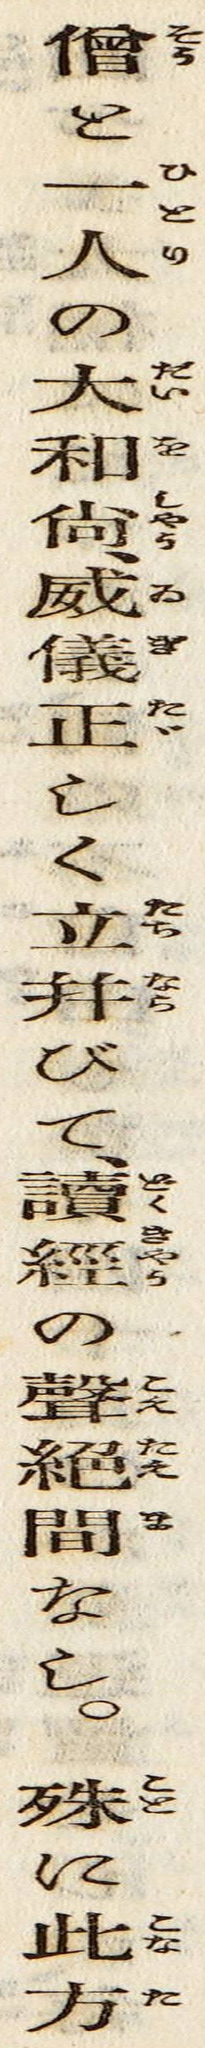僧と一人の大和尚、威儀正しく立幷びて、読経の声絶間なし。殊に此方
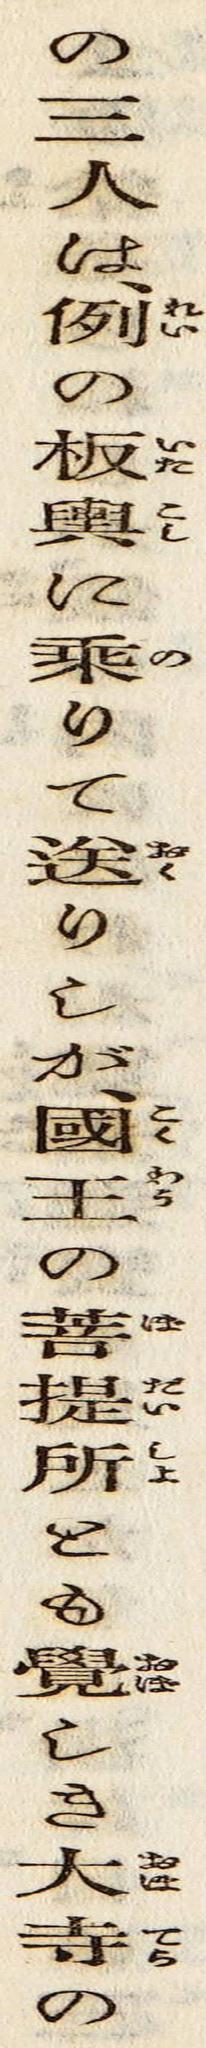の三人は、例の板輿に乗りて送りしが、国王の菩提所とも覚しき大寺の
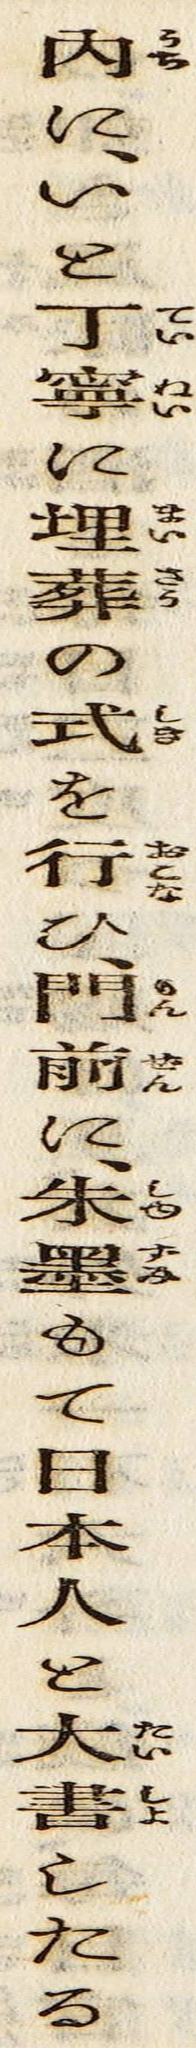内に、いと丁寧に埋葬の式を行ひ、門前に、朱墨もて日本人と大書したる
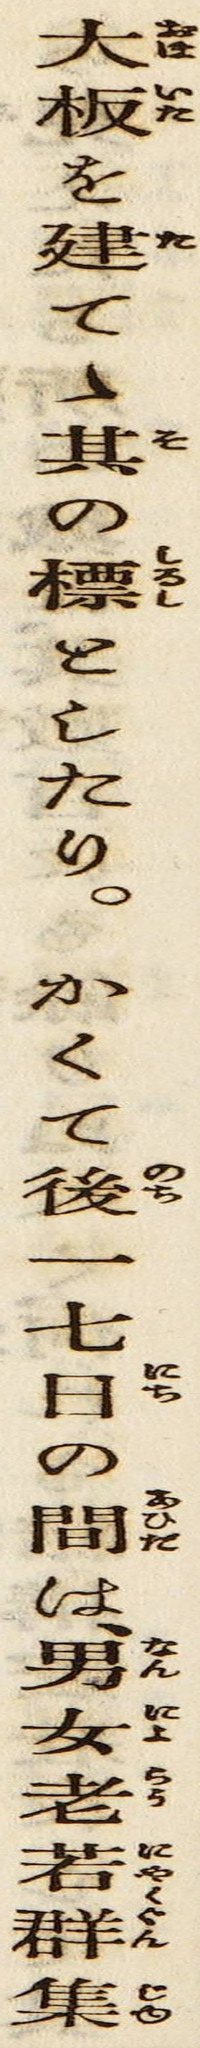大板を建てゝ其の標としたり。かくて後一七日の間は、男女老若群集
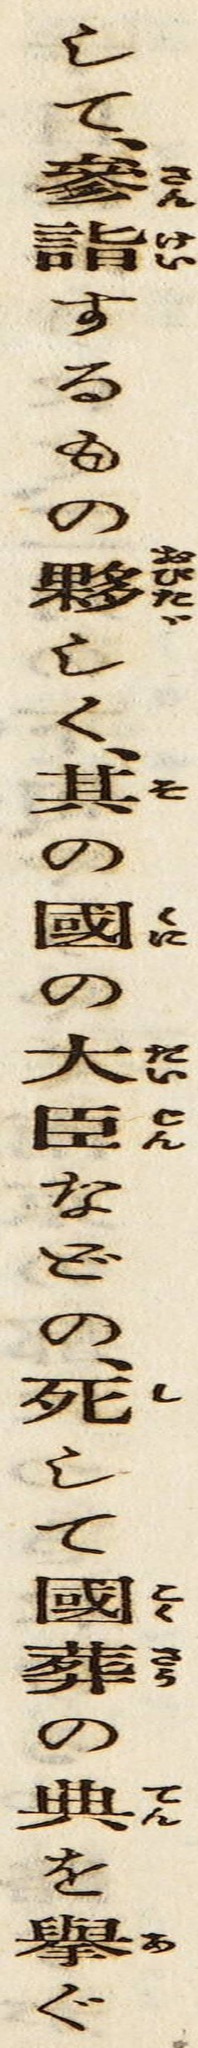して、参詣するもの夥しく、其の国の大臣などの、死して国葬の典を挙ぐ
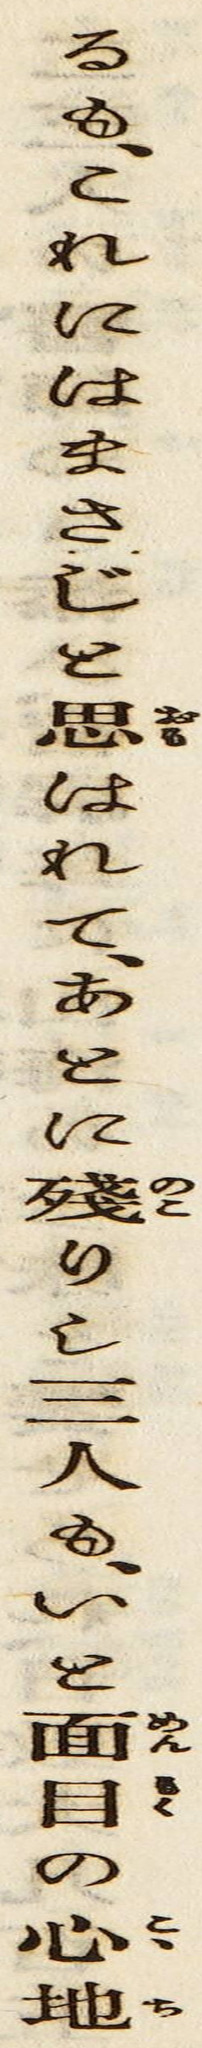るも、これにはまさじと思はれて、あとに残りし三人も、いと面目の心地
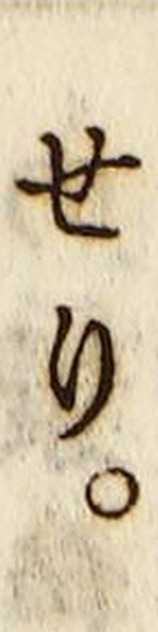せり。
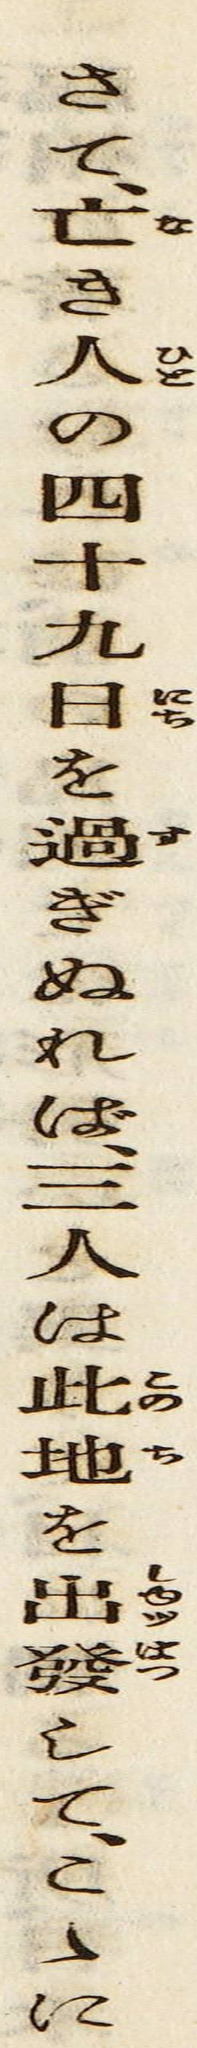さて、亡き人の四十九日を過ぎぬれば、三人は此地を出発して。こゝに
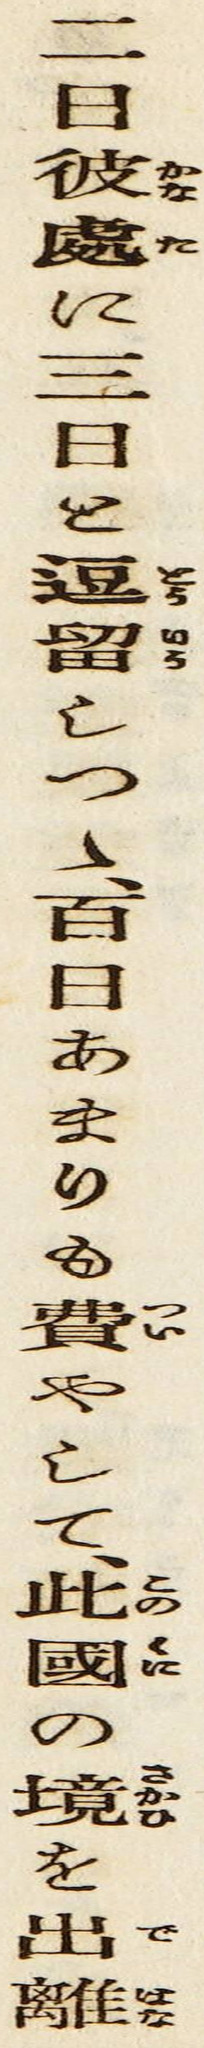二日彼処に三日と逗留しつゝ、百日あまりも費やして、此国の境を出離
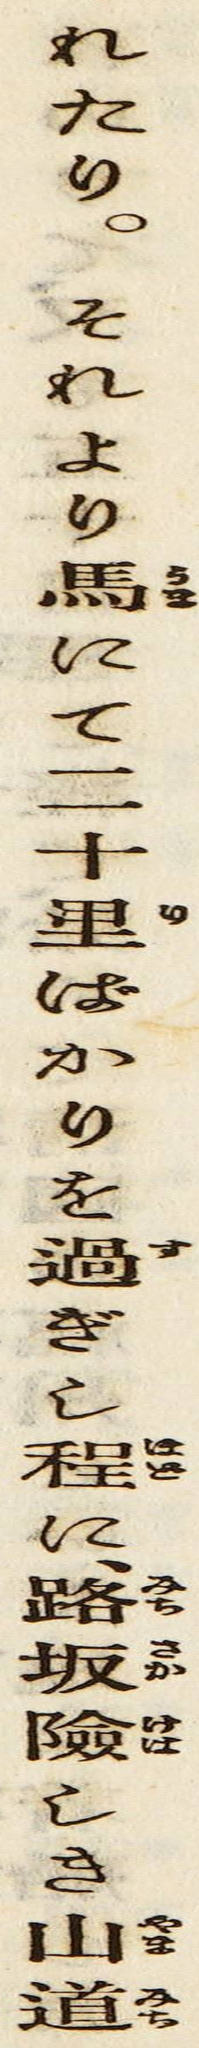れたり。それより馬にて二十里ばかりを過ぎし程に、路坂険しき山道
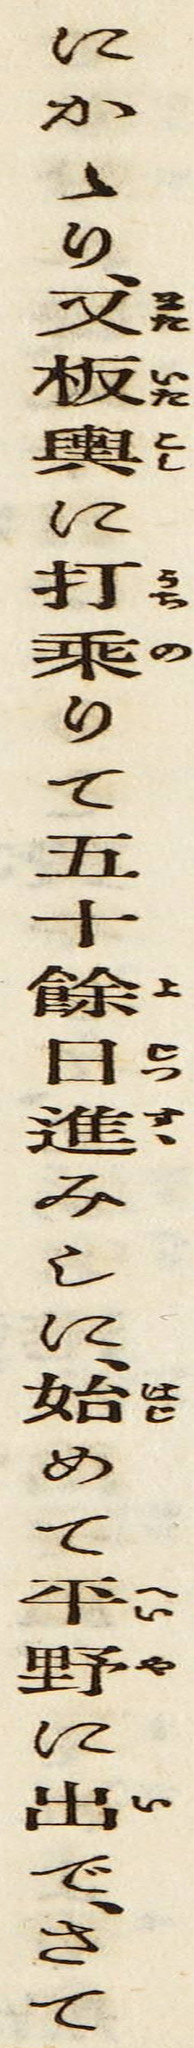にかゝり、又板輿に打乗りて五十余日進みしに、始めて平野に出で、さて
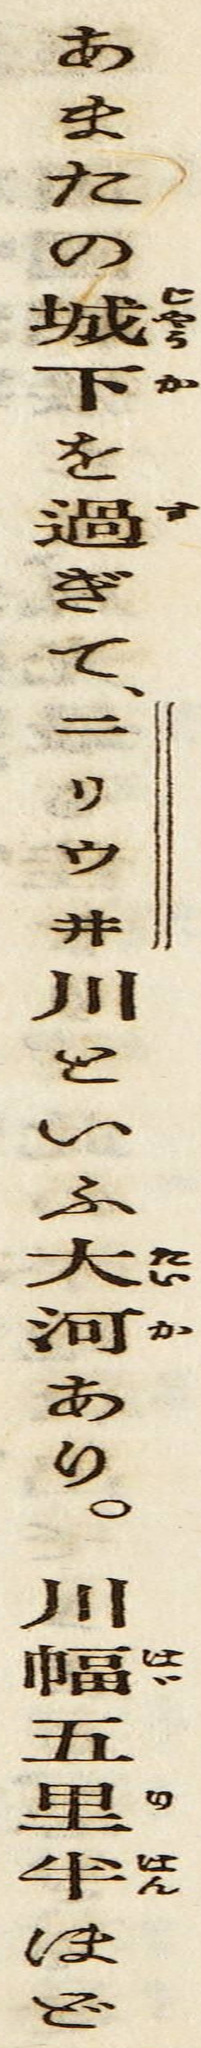あまたの城下を過ぎて、ニリウヰ川といふ大河あり。川幅五里半ほど
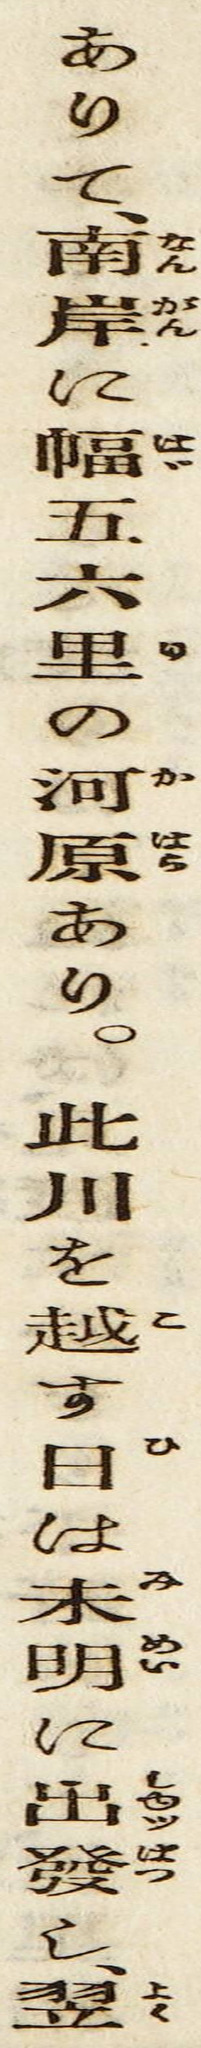ありて、南岸に幅五六里の河原あり。此川を越す日は未明に出発し、翌
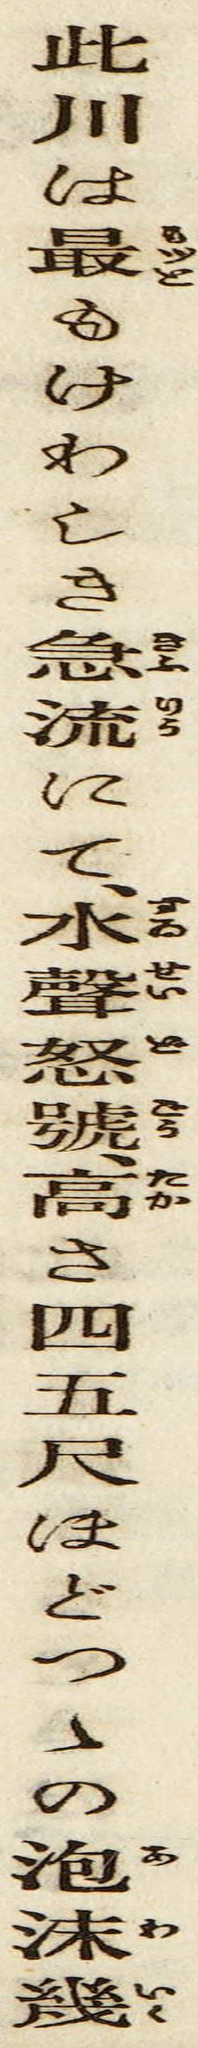此川は最もけわしき急流にて、水声怒号、高さ四五尺ほどつゝの泡沫幾

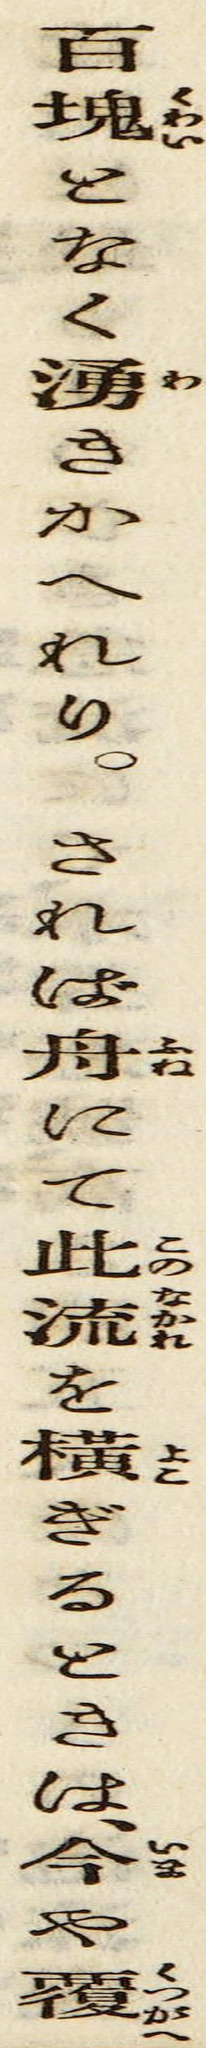百塊となく湧きかへれり。されば舟にて此流を横ぎるときは、今や覆
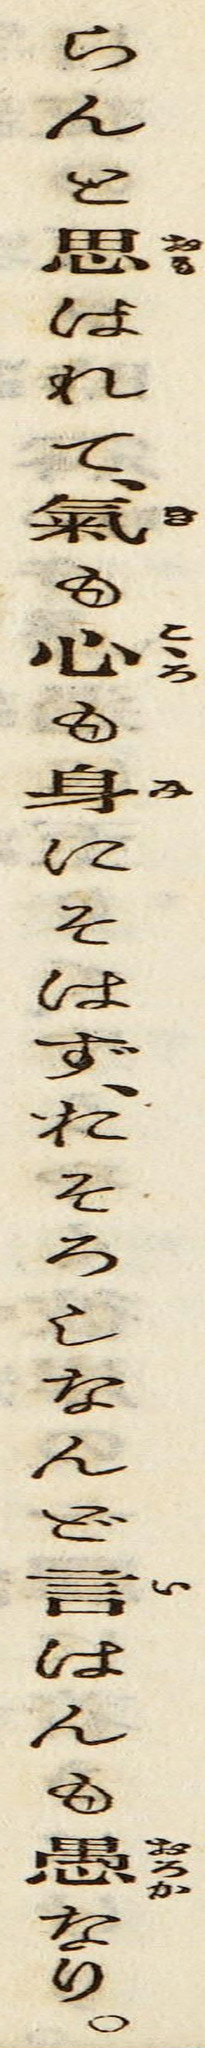らんと思はれて、気も心も身にそはず、おそろしなんど言はんも愚なり。
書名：日本漂流譚
